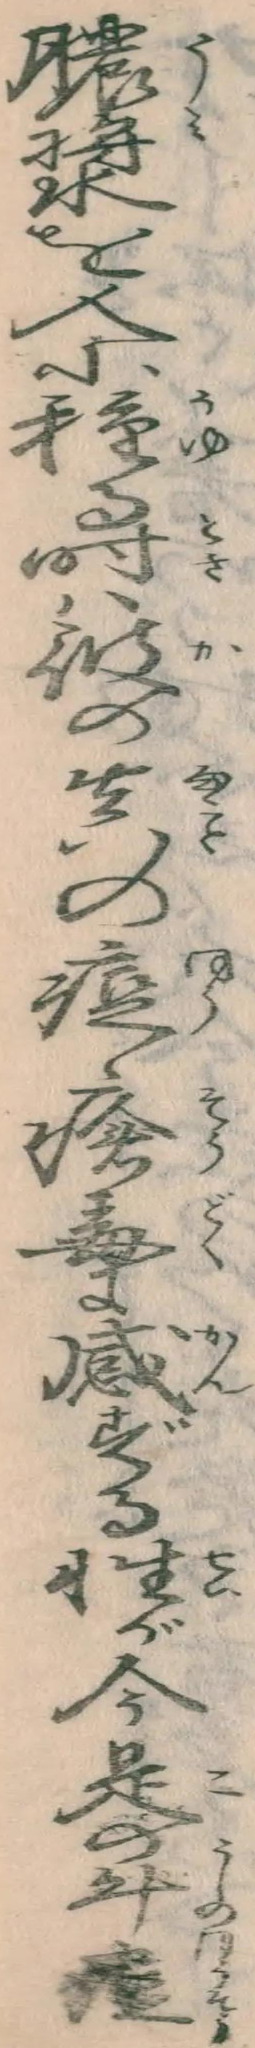膿漿を人に種る時は彼の真の痘瘡毒に感ずる性が今是の牛痘
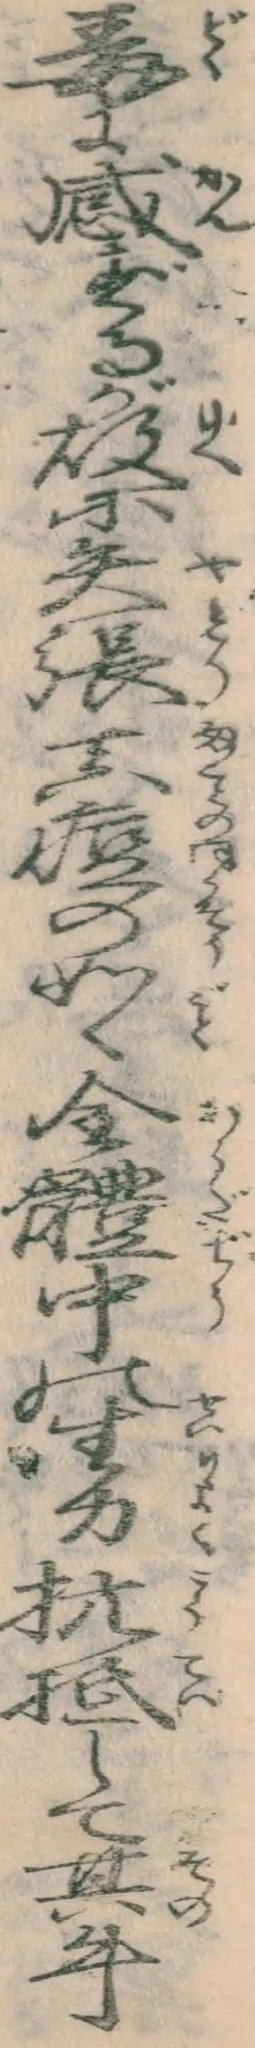毒に感ずるが故に矢張真痘の如く全体中の生力抗抵して其牛
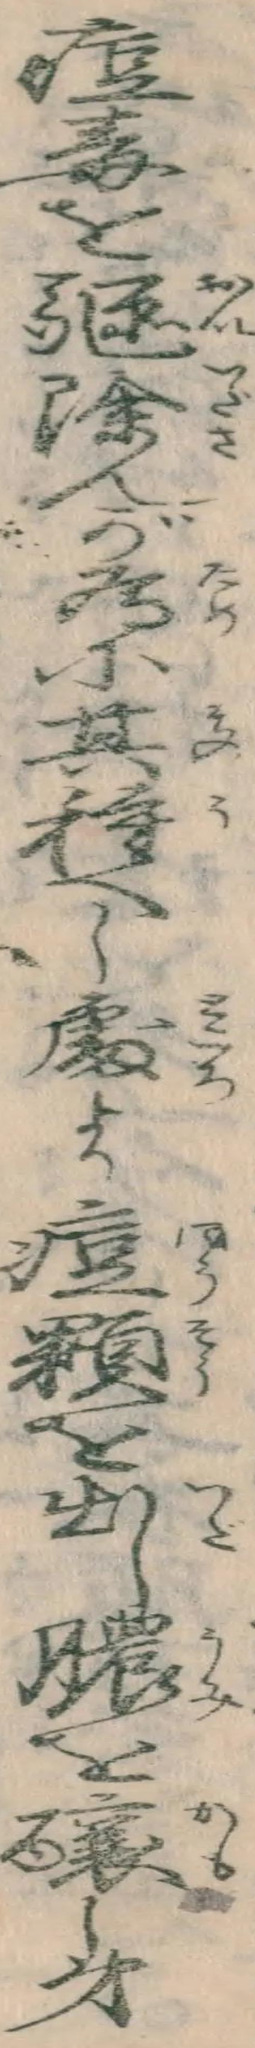痘毒を駆除んが為に其種へし処より痘顆を出し膿を醸し第
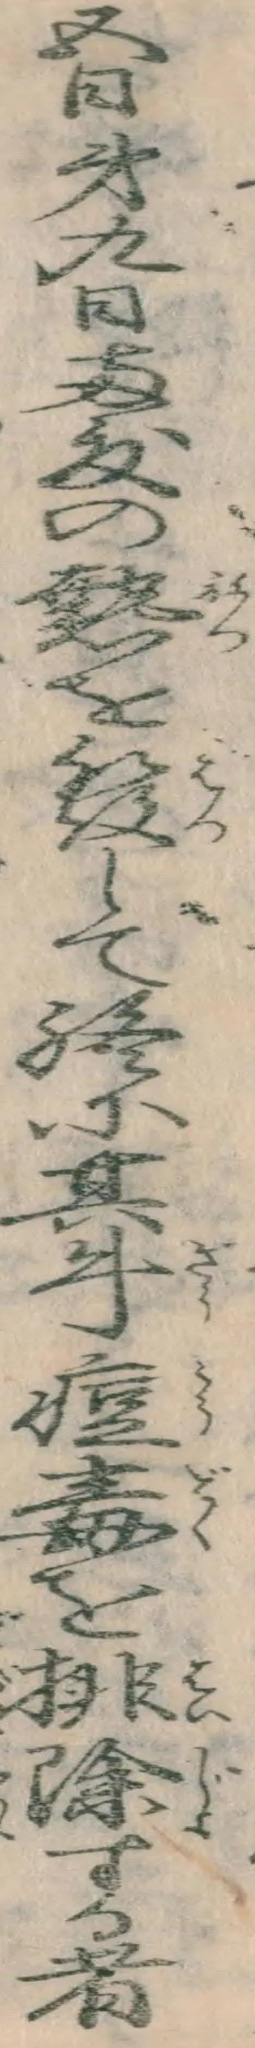五日第九日両度の熱を発して終に其牛痘毒を排除する者
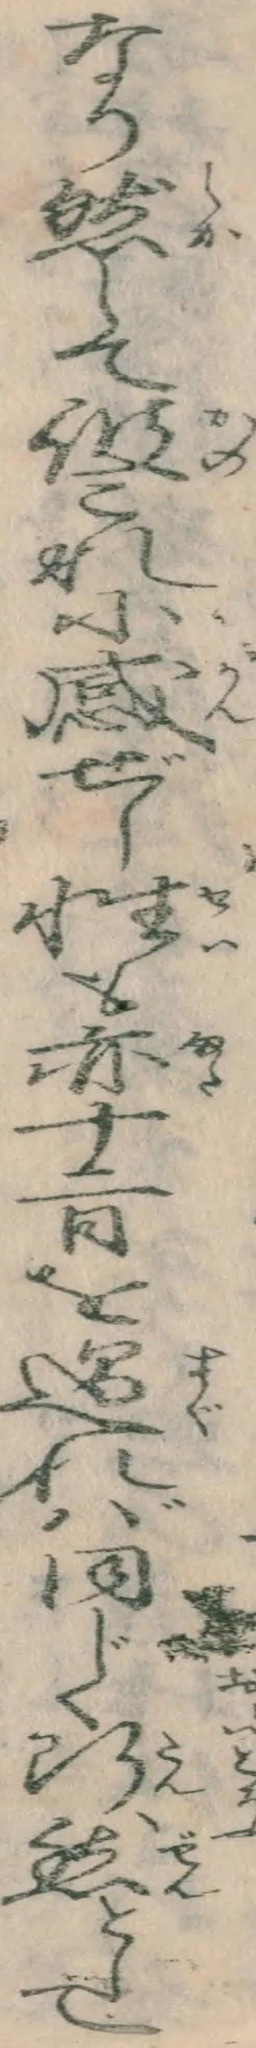なり然して彼これに感ぜし性も亦十二日を過れば断然として
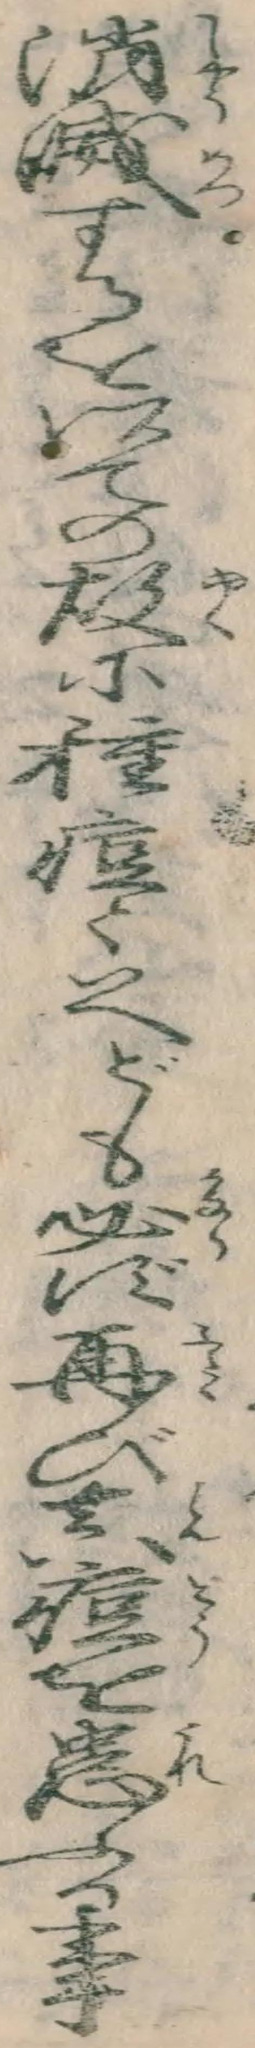消滅するを以ての故に種痘といへども必ず再び真痘を患ふる事
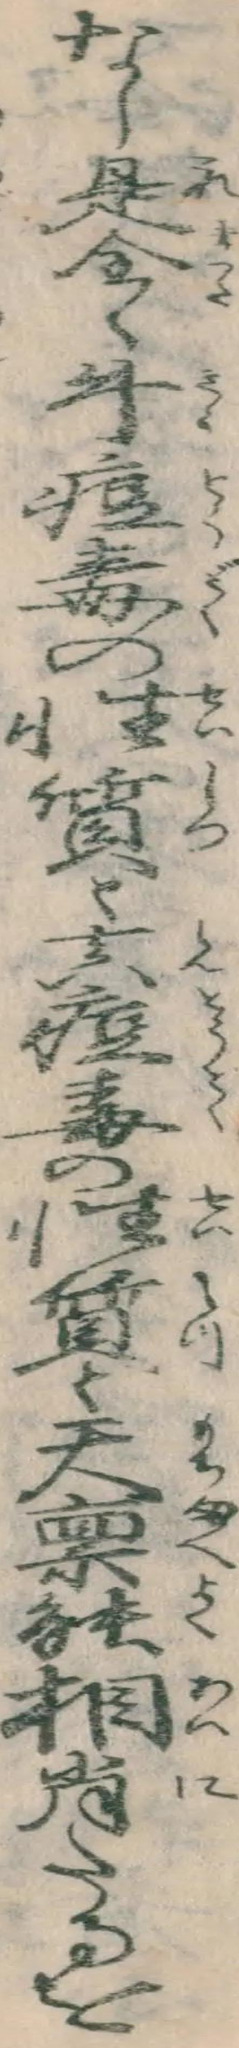なし是全く牛痘毒の性質と真痘毒の性質と天稟能相肖たるを
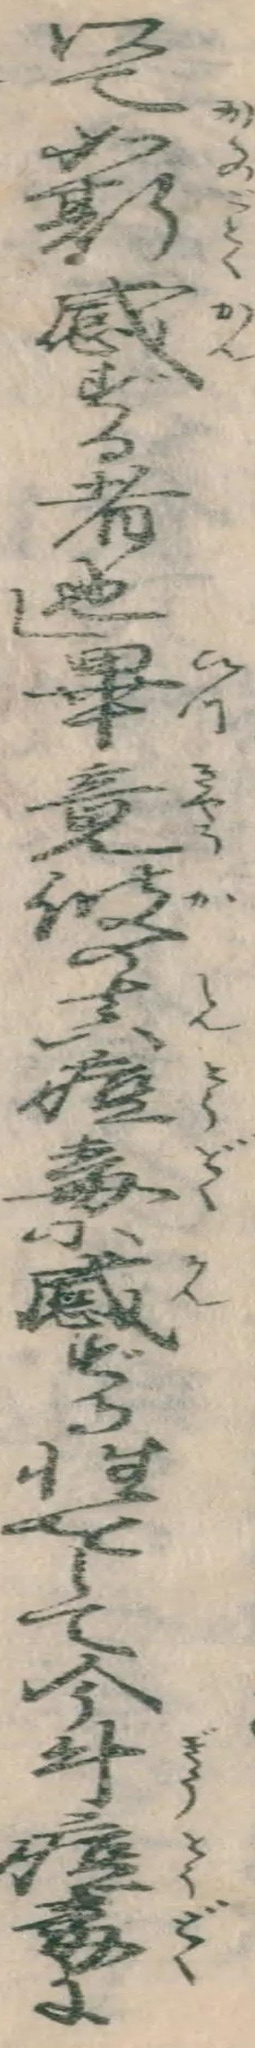以て如斯感ずる者也」畢竟彼の真痘毒に感ぜる性をして今牛痘毒に
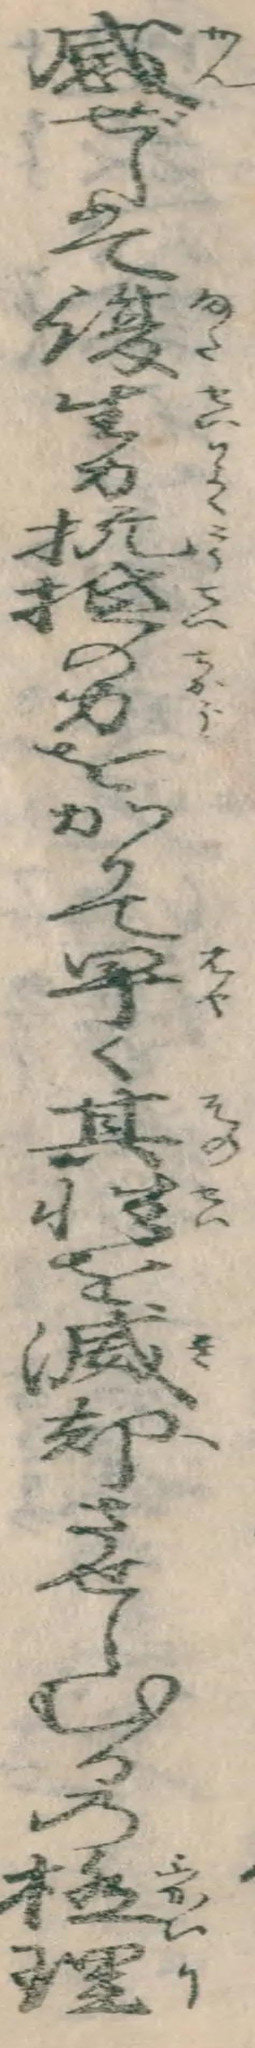感ぜしめて復生力抗抵の力をかりて早く其性を滅却させしむるの極理
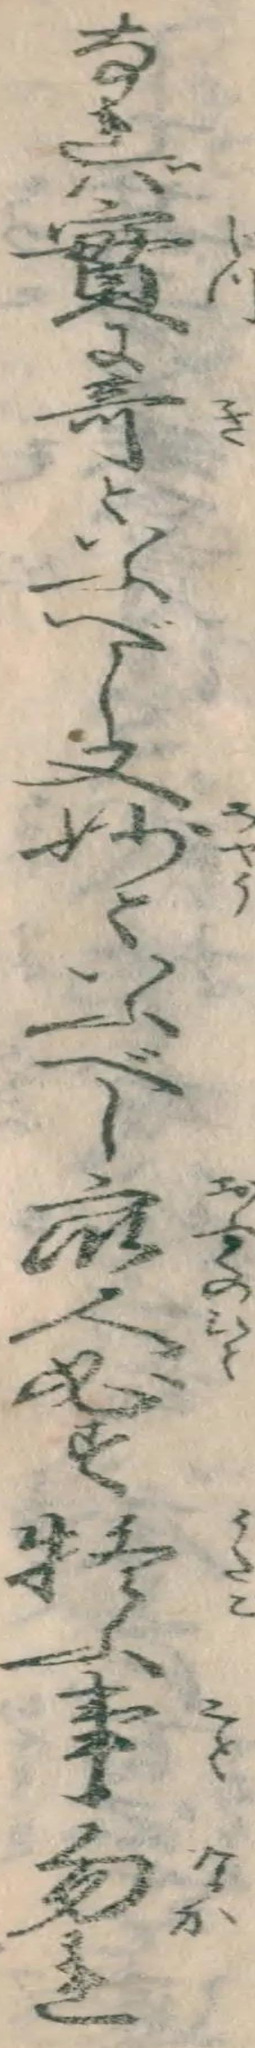なれば実に奇といふべし又妙といふべし衆人必すふ事勿れ

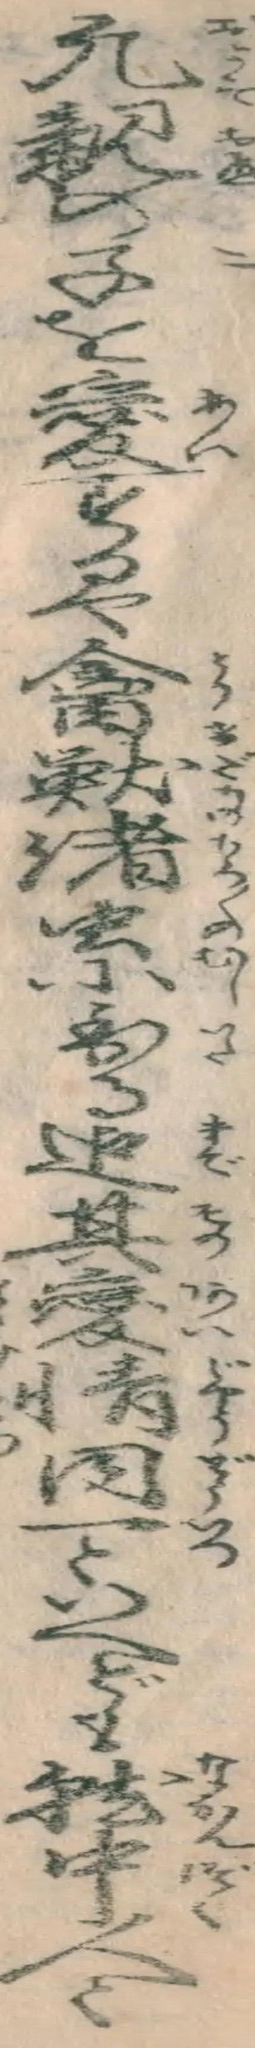凡親の子を愛するや禽獣諸虫に至る迄其愛情同一といへども就中人と
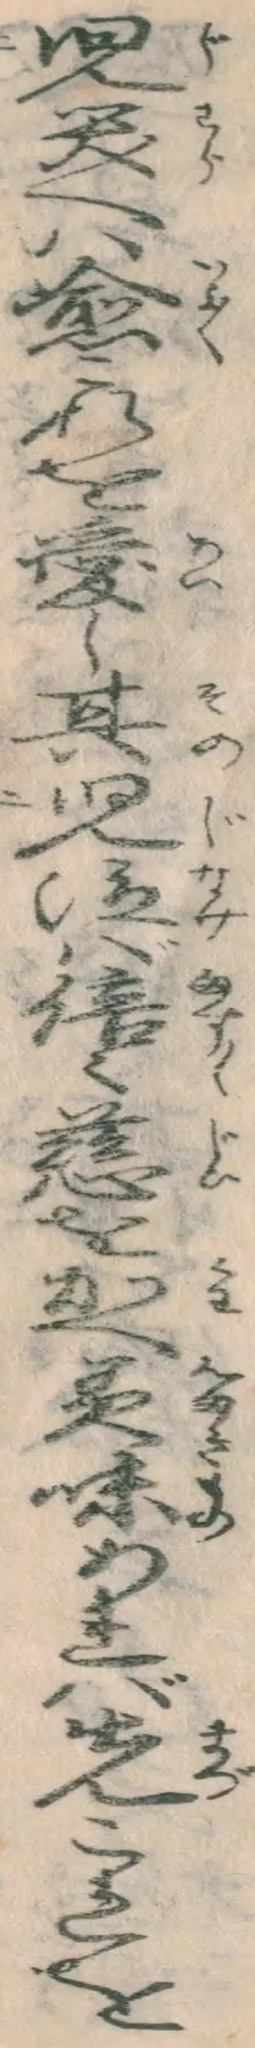児笑へは愈これを愛し其児泣ば倍々慈を加へ美味あれば先これを
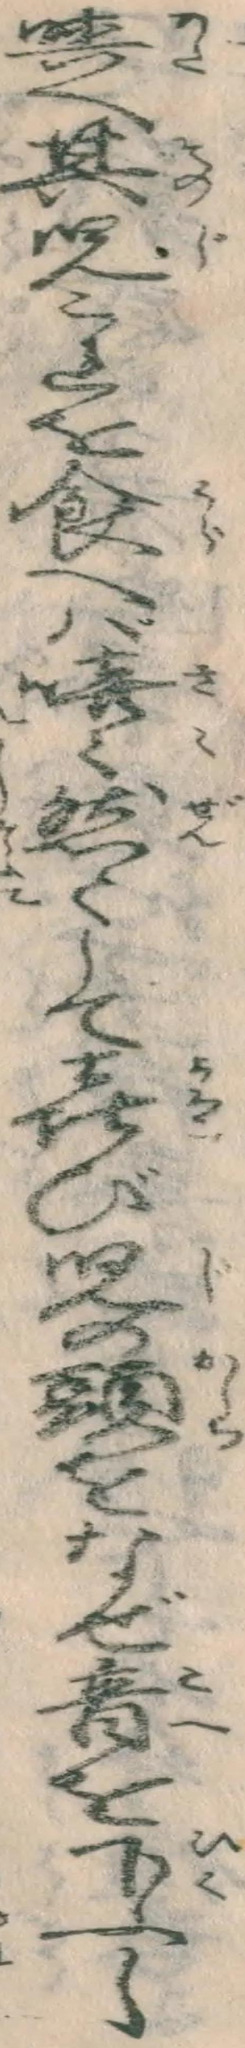与へ其児これを食へば喜々然として喜び児の頭をなぜ音を下ふし
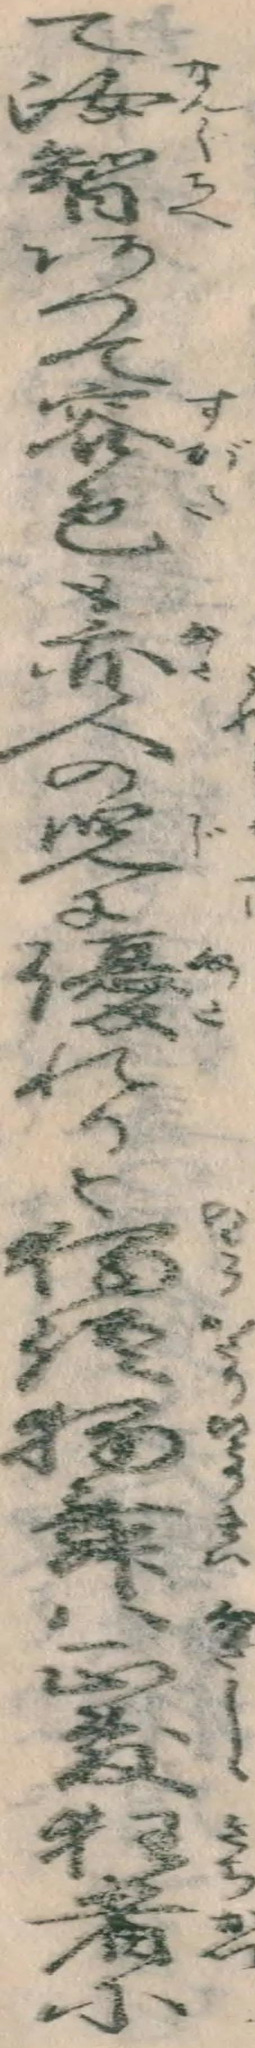て汝智あつて容色も亦人の児に優れりと独語独舞は正敷狂者に
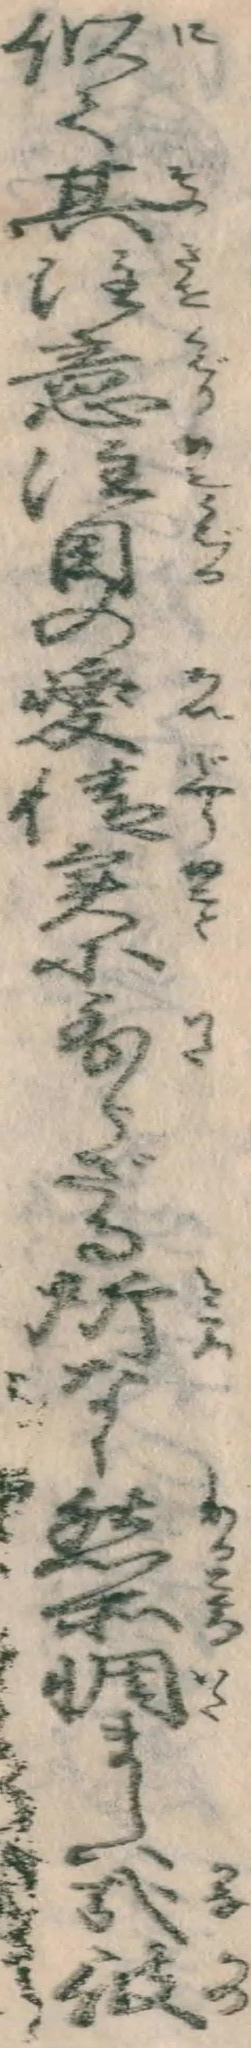似て其注意注目の愛情実に至らざる所なく然所惆ましい哉彼
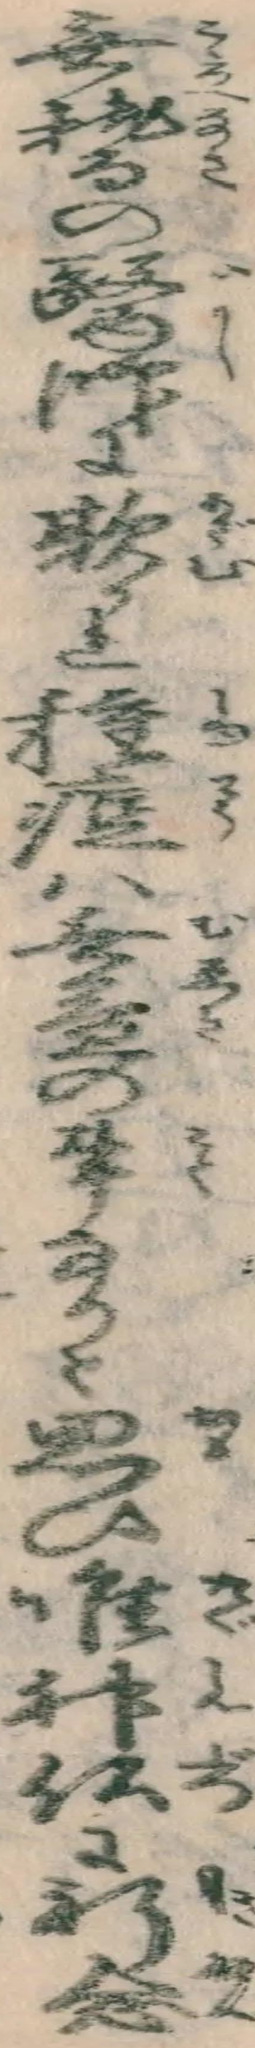無稽の医師に欺かれ種痘は無益の事なりと思ひ唯神仏に祈念
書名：種痘辨
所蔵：国立国会図書館 National Diet Library, JAPAN
